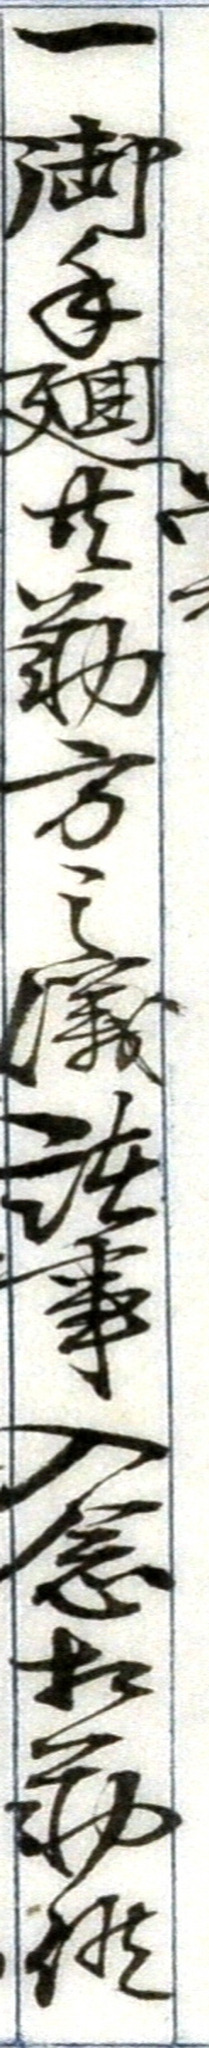一御手廻共勤方之儀諸事入念相勤候
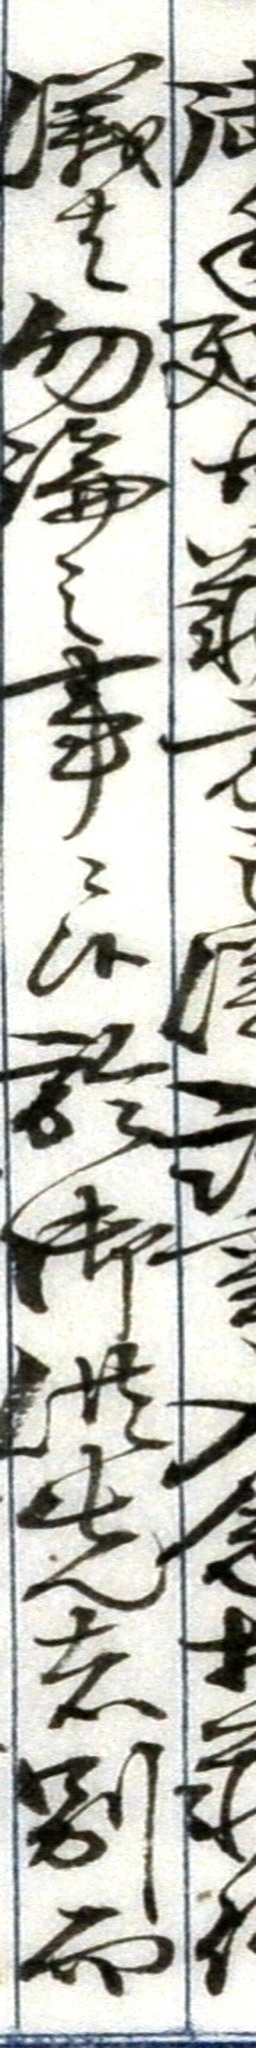儀は勿論之事ニ候於御供先は別而
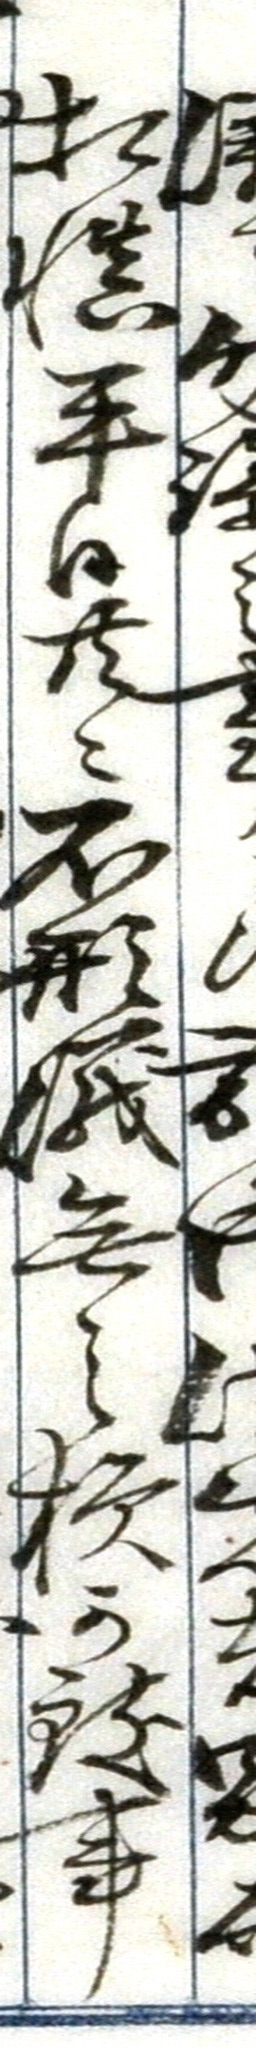相慎平日共ニ不形儀無之様可致事
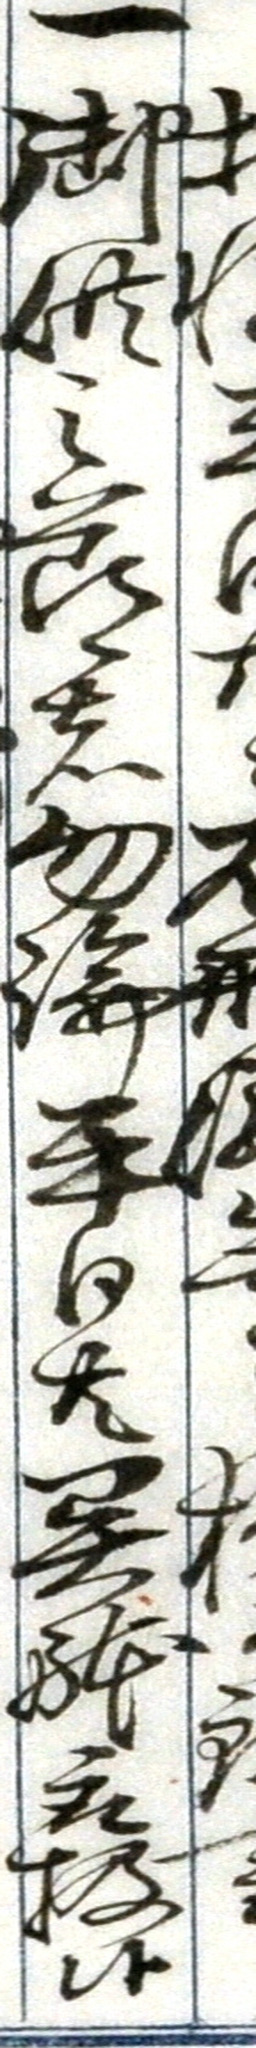一御供之節々は勿論平日共異躰取扱候
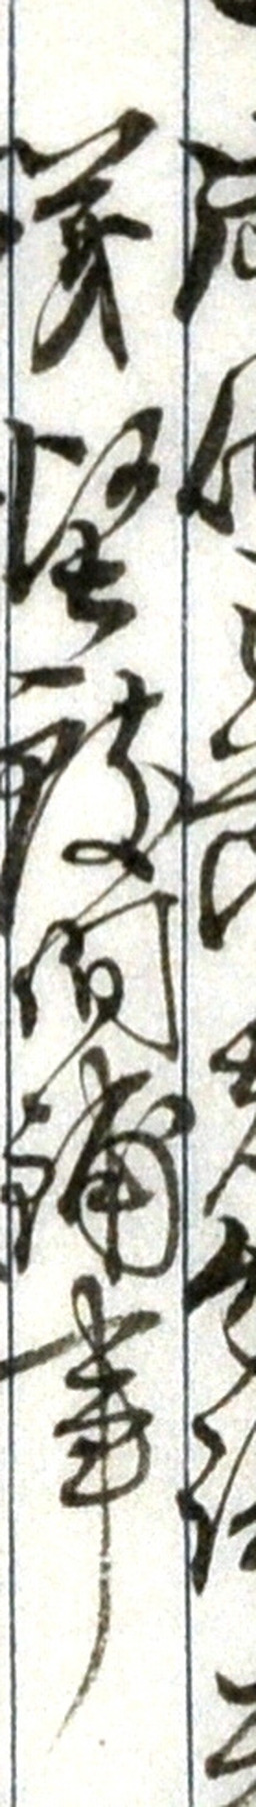義堅致間鋪事
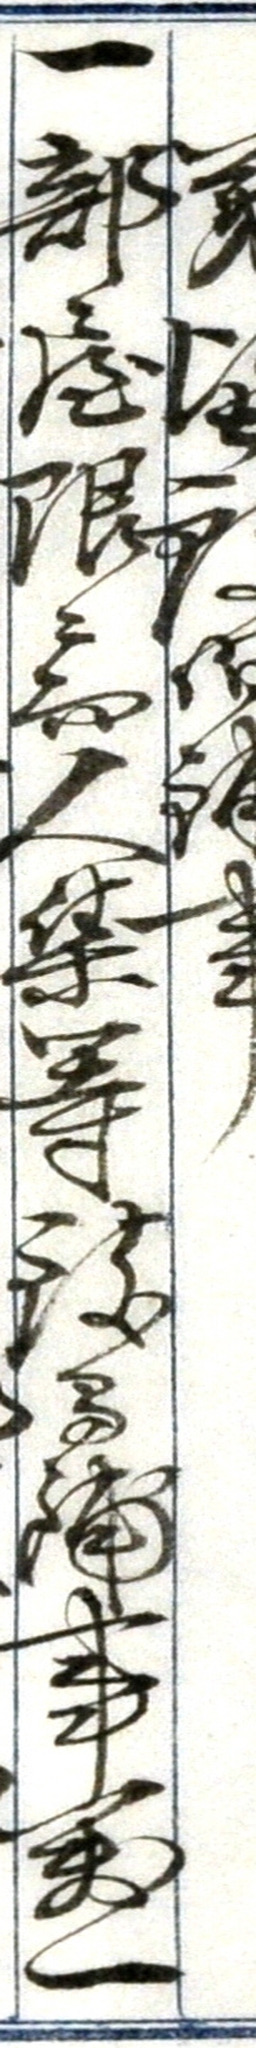一部屋限ニ而人集等致間鋪事萬一
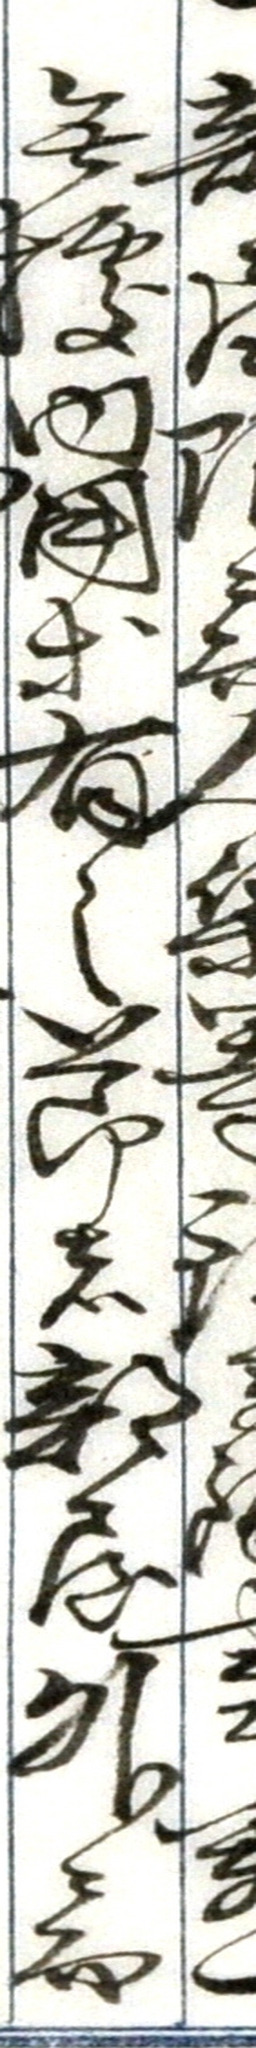無拠内用等有之節は部屋外ニ而
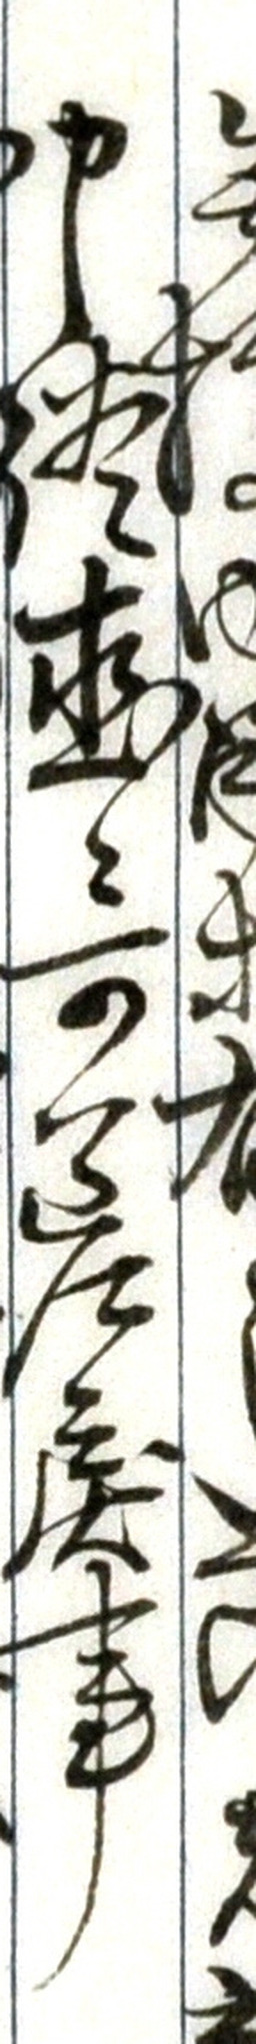申談直ニ可差戻事
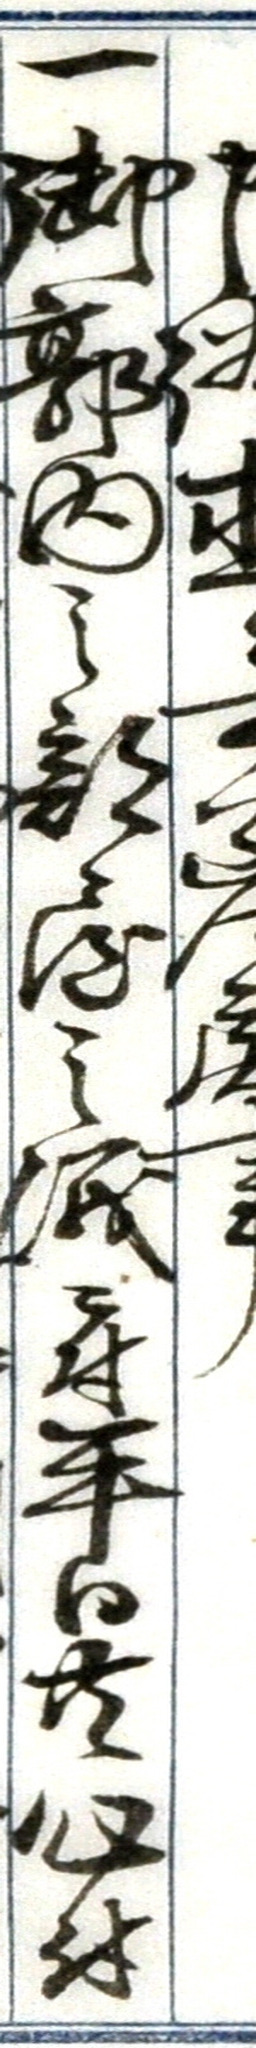一御郭内之部屋之儀ニ付平日共心付
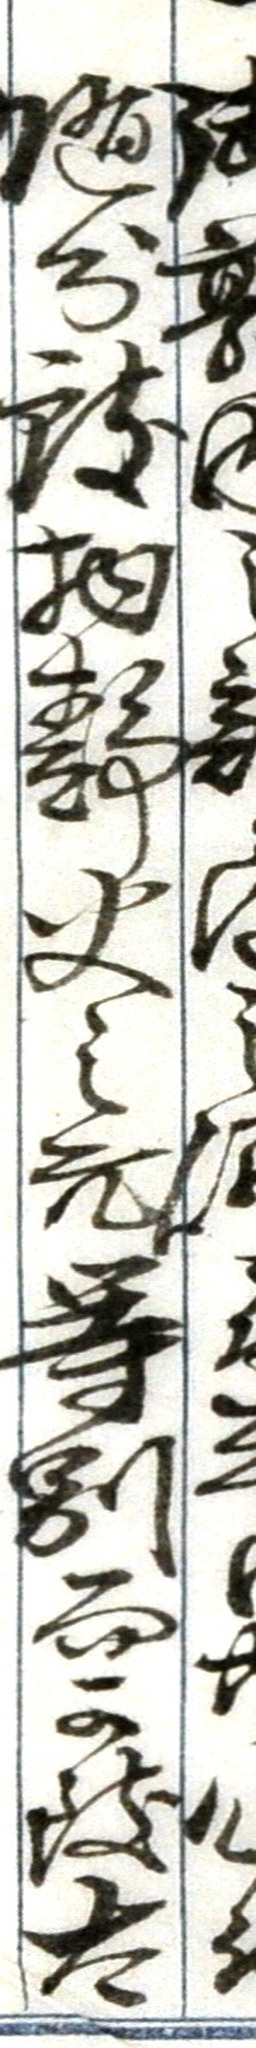随分致物静火之元等別而可致太

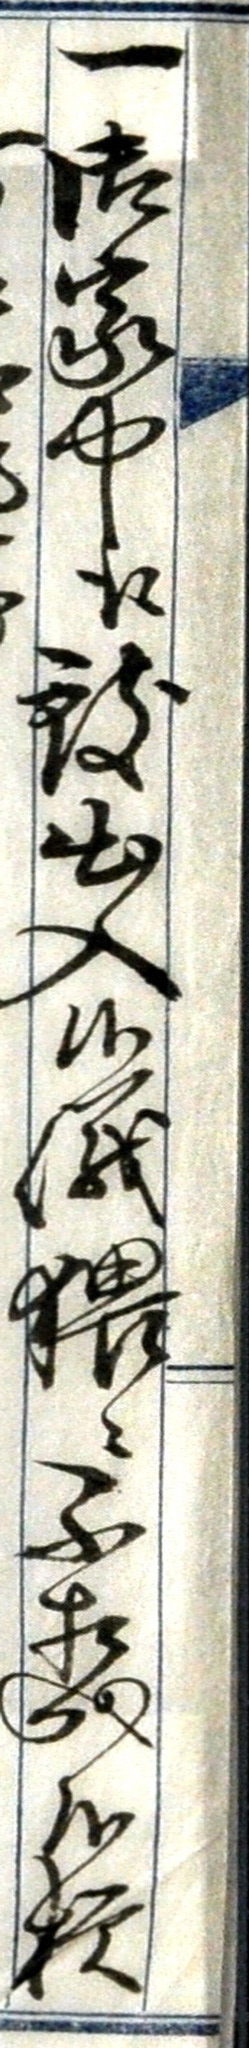一御家中え致出入候儀猥ニ不相成候様
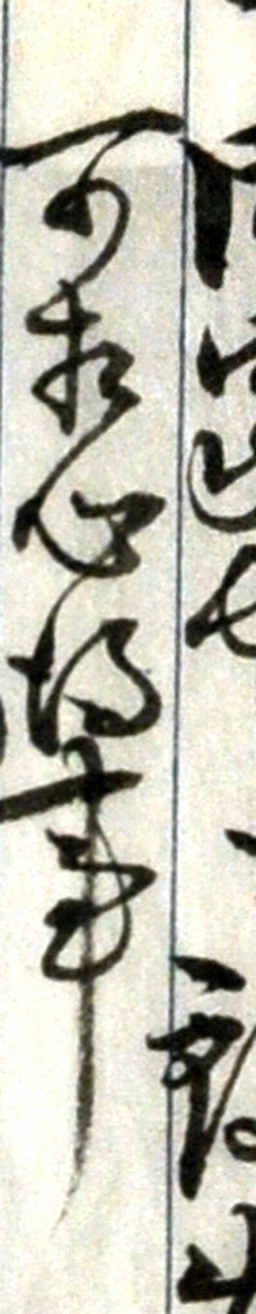可相心得事
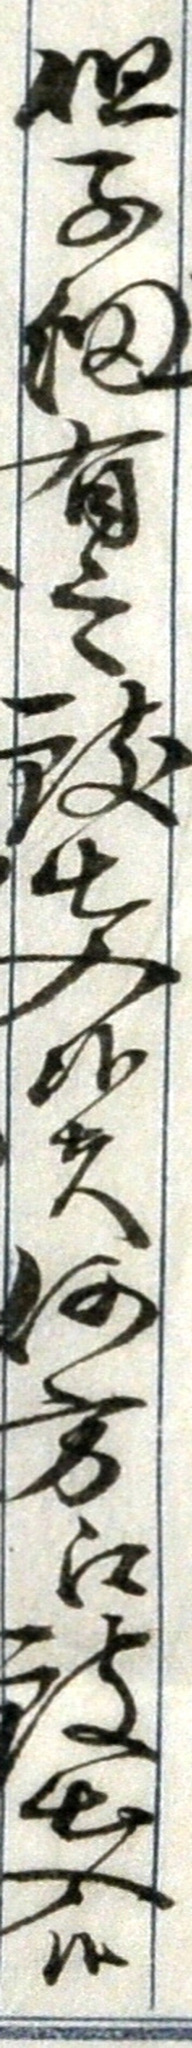但子細有之致出入候者何方え致出入候
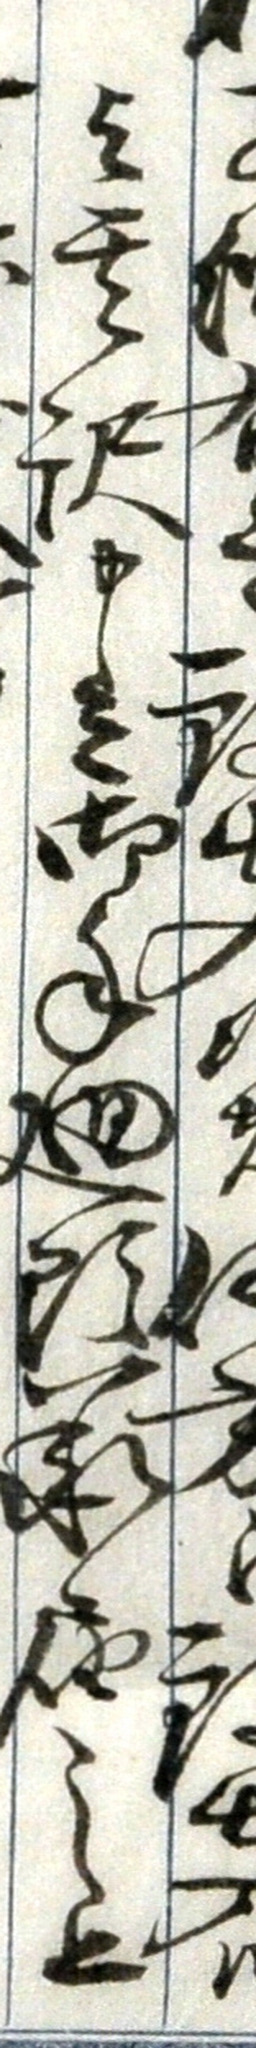と其訳申立御手廻頭承届之上
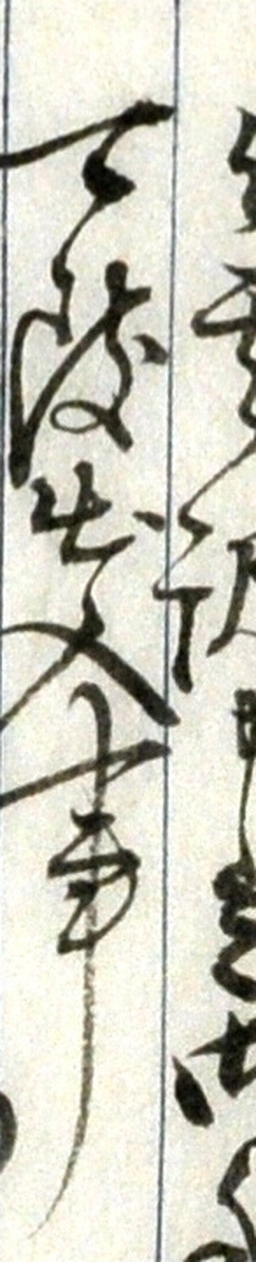可致出入事
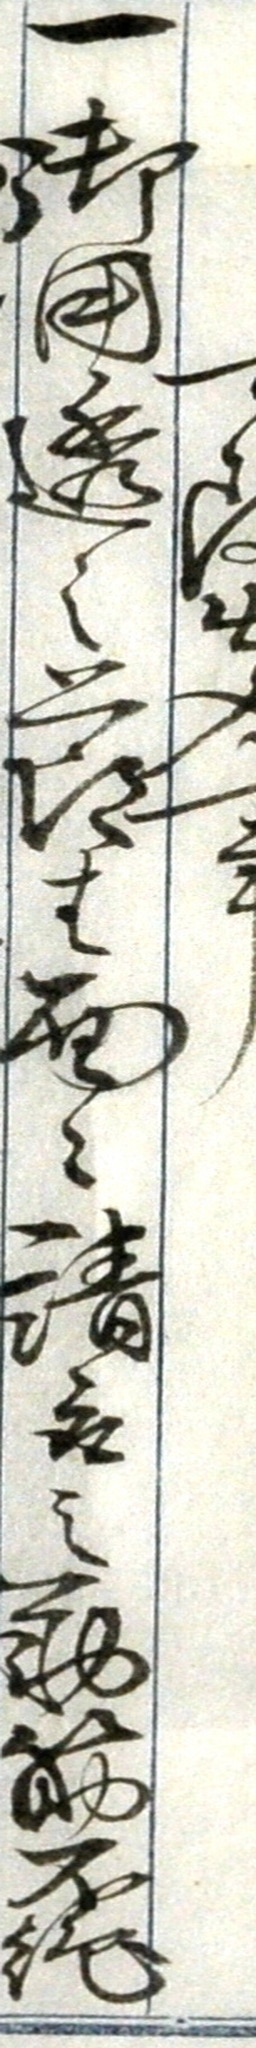一御用透之節は面々請取之勤筋不絶
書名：御手廻之者心得覚書
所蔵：伊那市立高遠町図書館・合同会社AMANE
